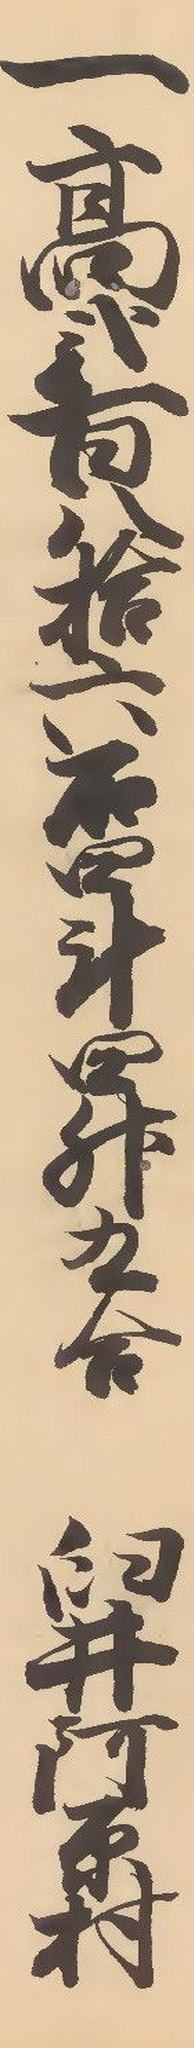一高弐百八拾六石四斗四升九合臼井阿原村
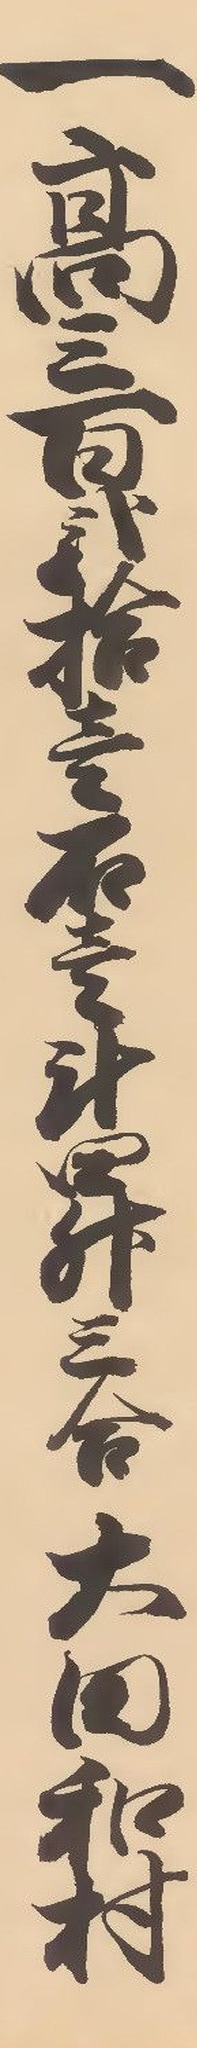一高三百弐拾壱石壱斗四升三合大田和村
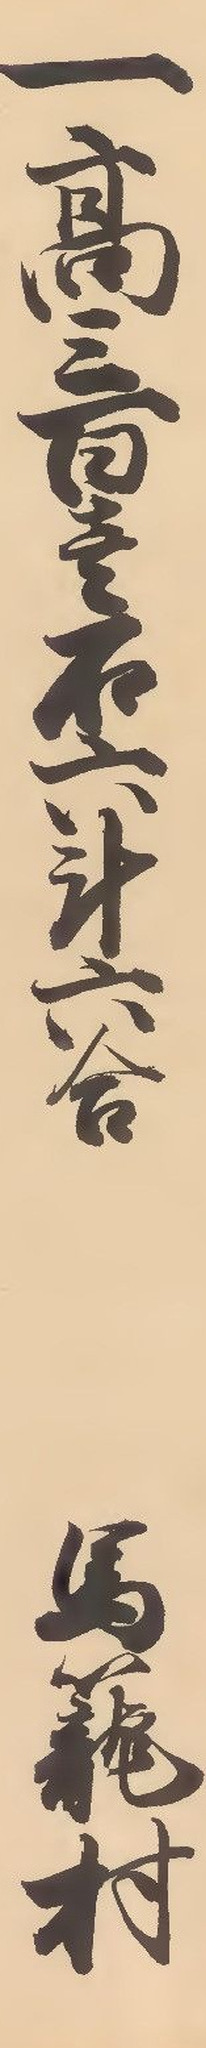一高三百壱石六斗六合馬籠村
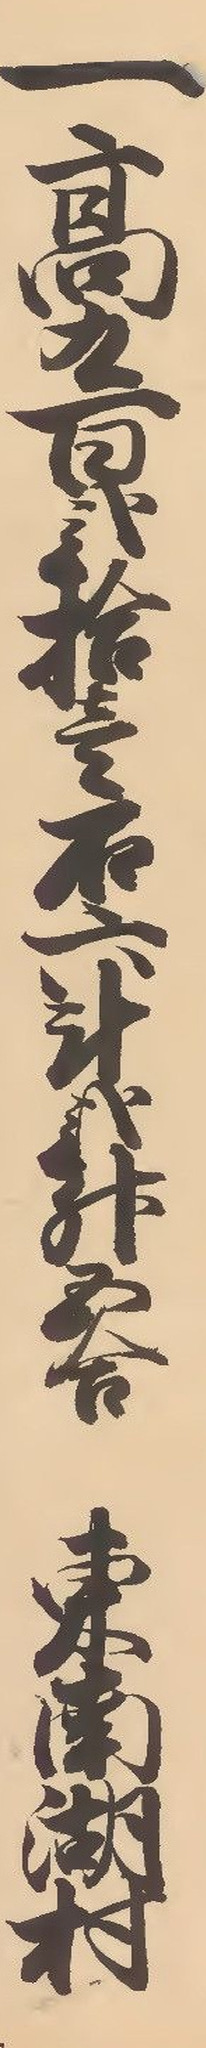一高九百弐拾壱石六斗弐升五合東南湖村
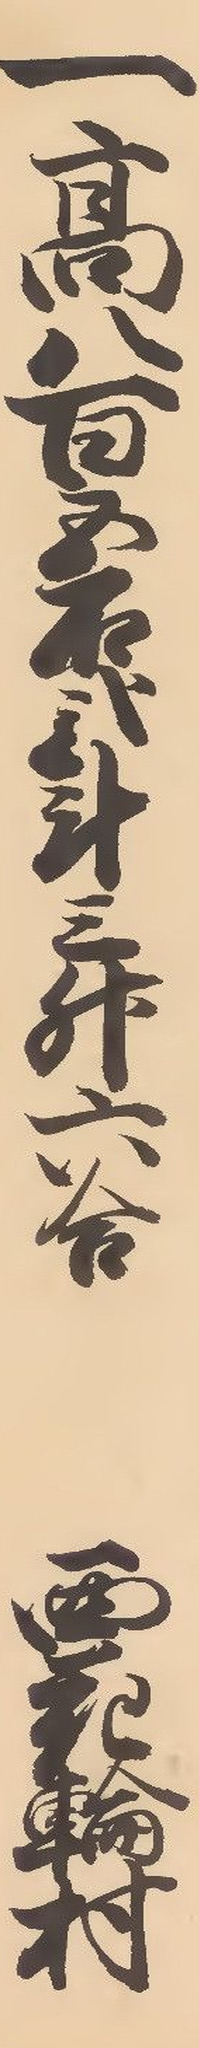一高八百五石弐斗三升六合西花輪村
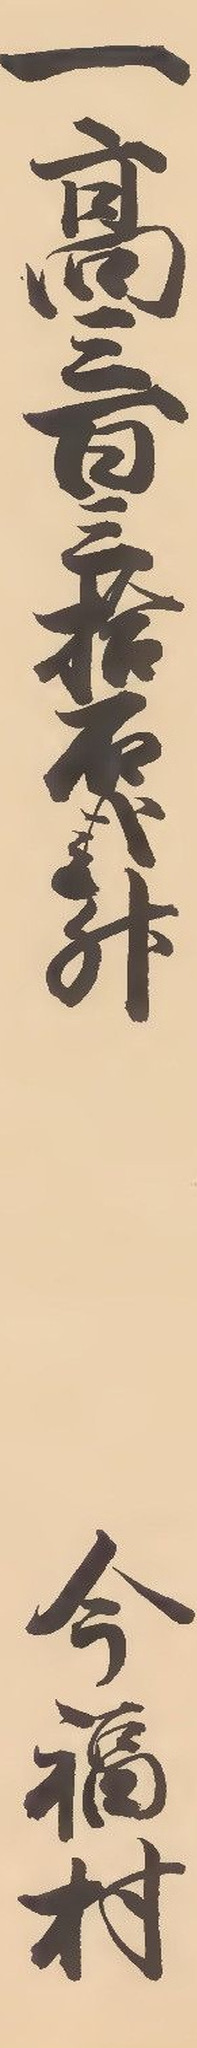一高三百三拾石弐升今福村
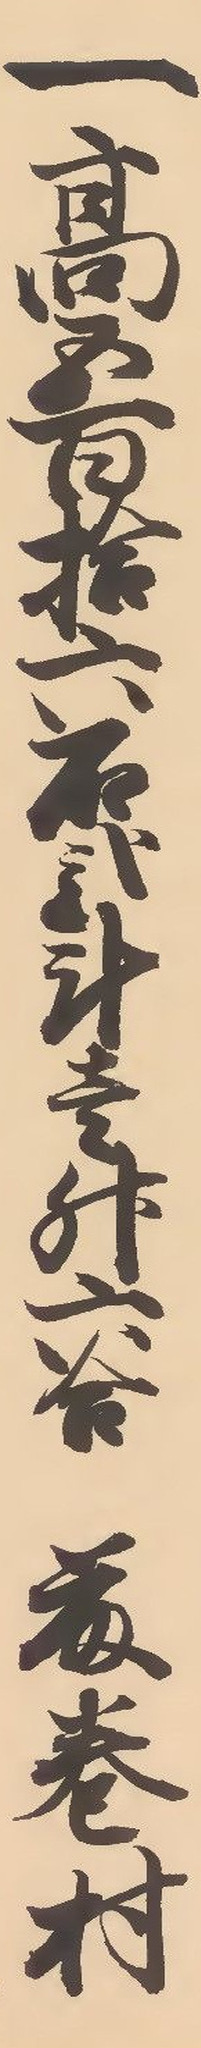一高五百拾六石弐斗壱升六合藤巻村
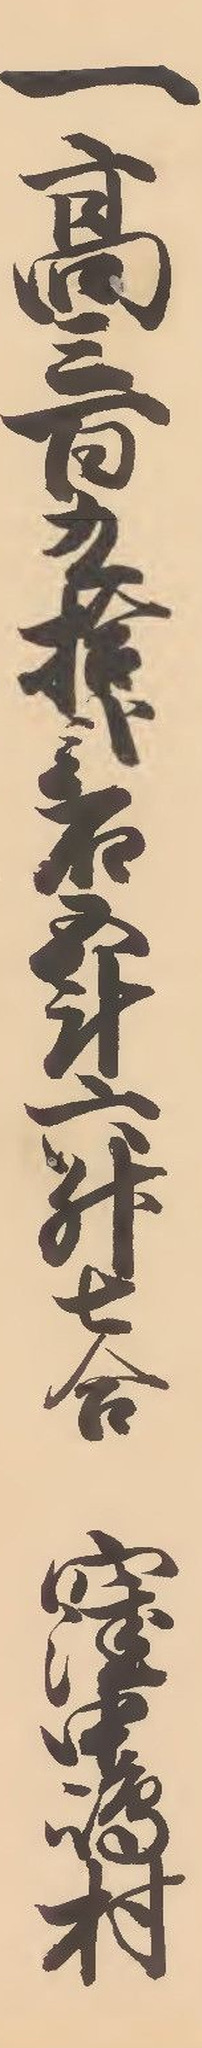一高三百九拾弐石五斗六升七合窪中島村

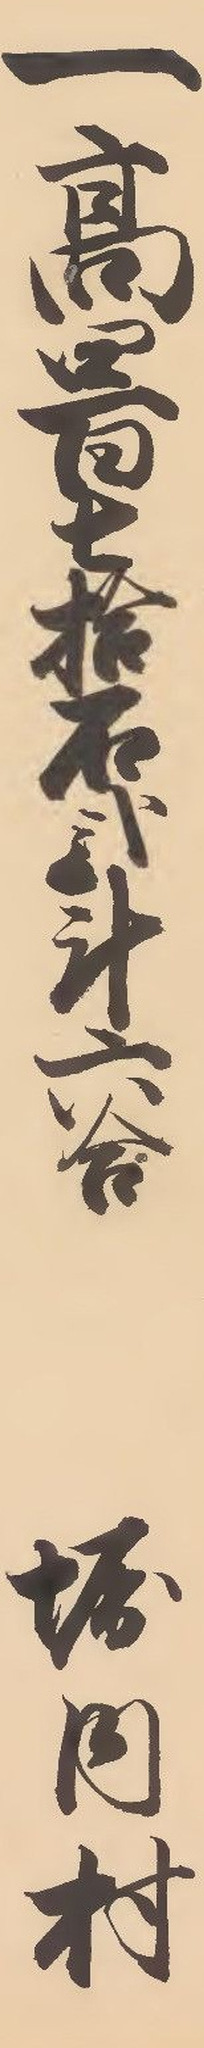一高四百七拾石弐斗六合堀内村
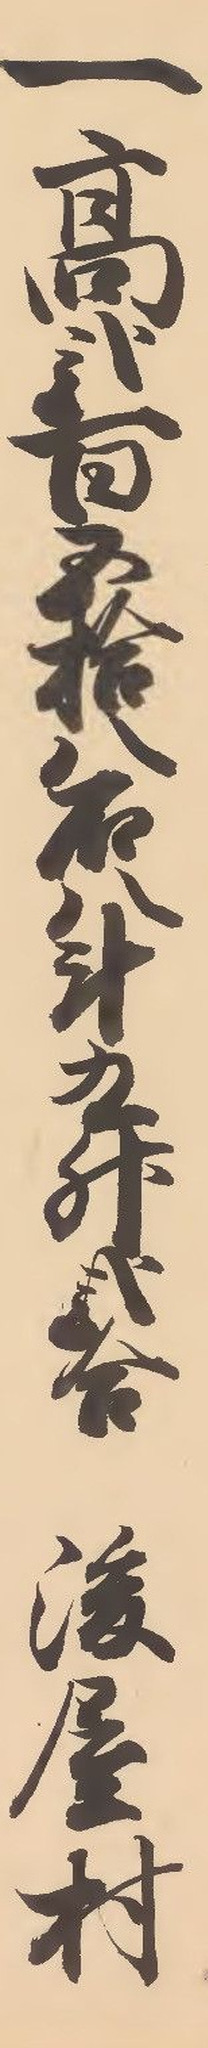一高弐百五拾八石八斗九升弐合後屋村
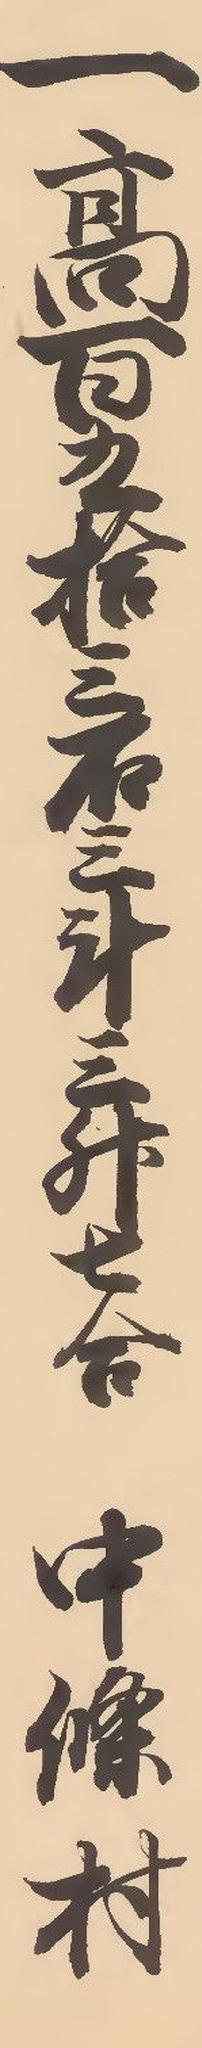一高百九拾三石三斗三升七合中条村
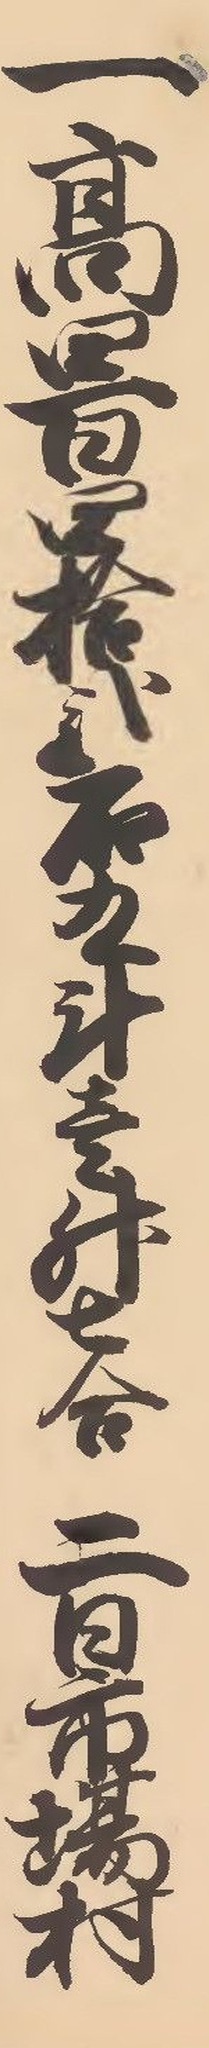一高四百四拾弐石九斗壱升七合二日市場村
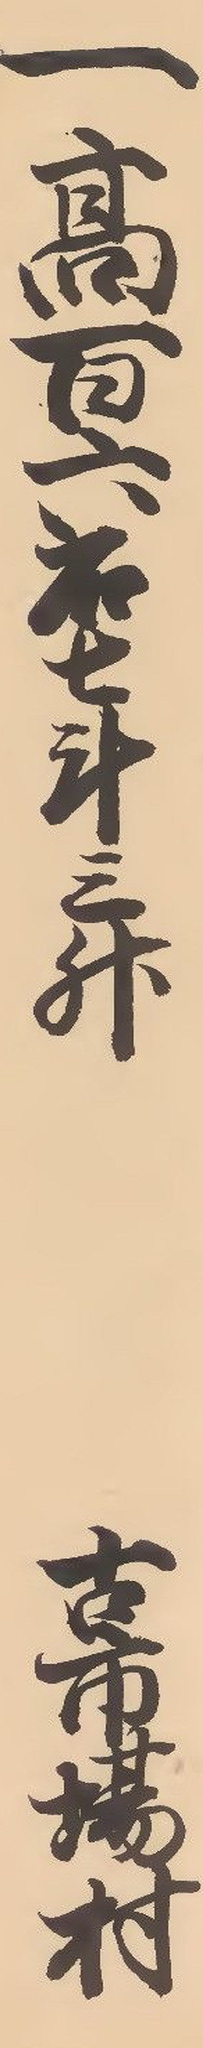一高百六石七斗三升古市場村
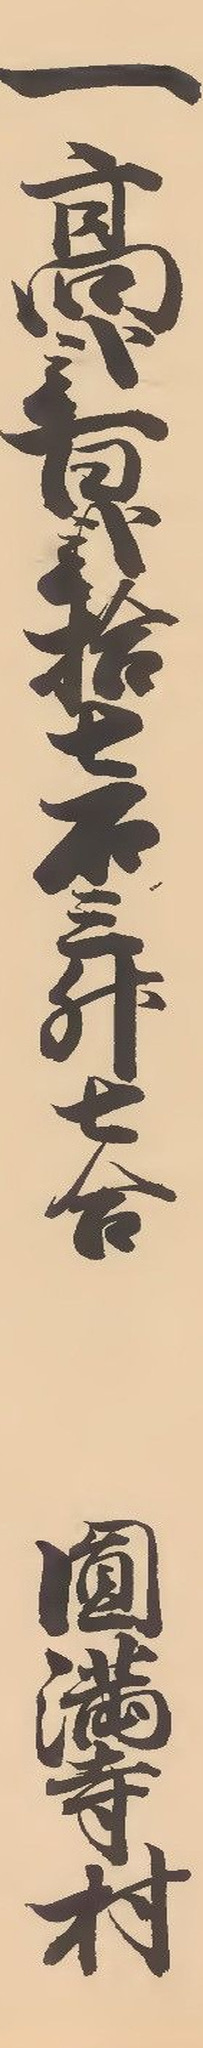一高弐百弐拾七石三升七合円満寺村
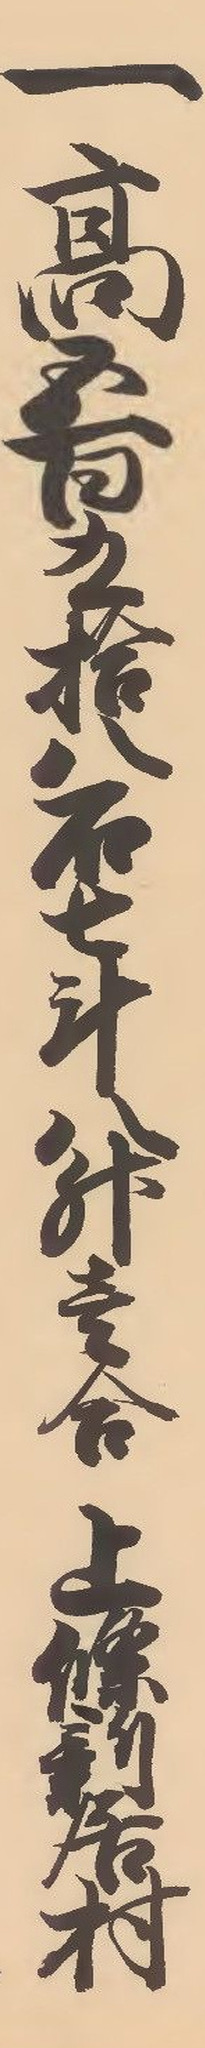一高五百九拾八石七斗八升壱合上条新居村
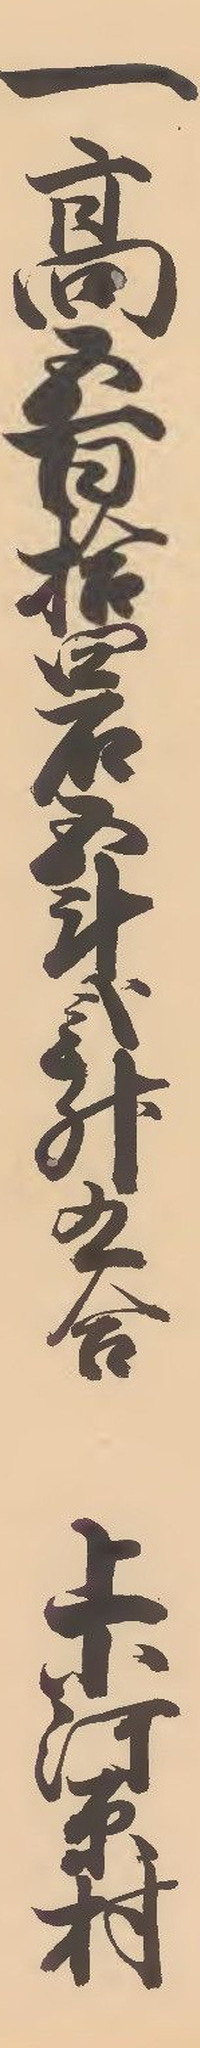一高五百拾四石五斗弐升九合上小河原村
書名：甲斐国郷帳
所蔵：国立公文書館 National Archives of Japan
